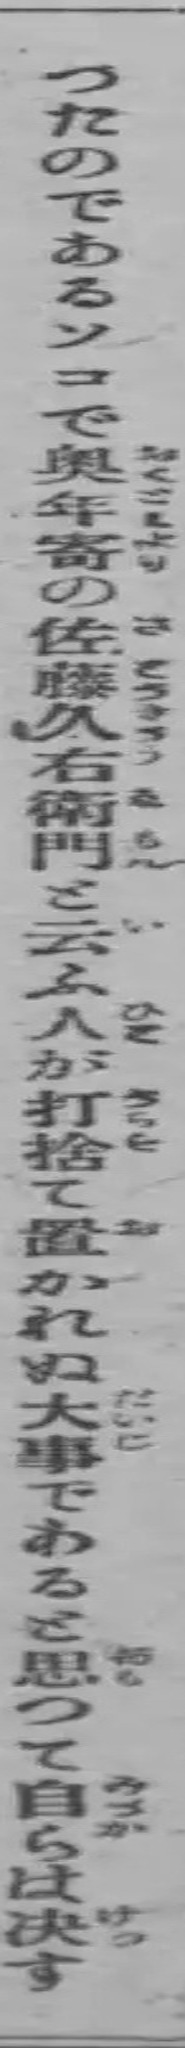つたのであるソコで奥年寄の佐藤久右衛門と云ふ人が打捨て置かれぬ大事であると思つて自らは決す
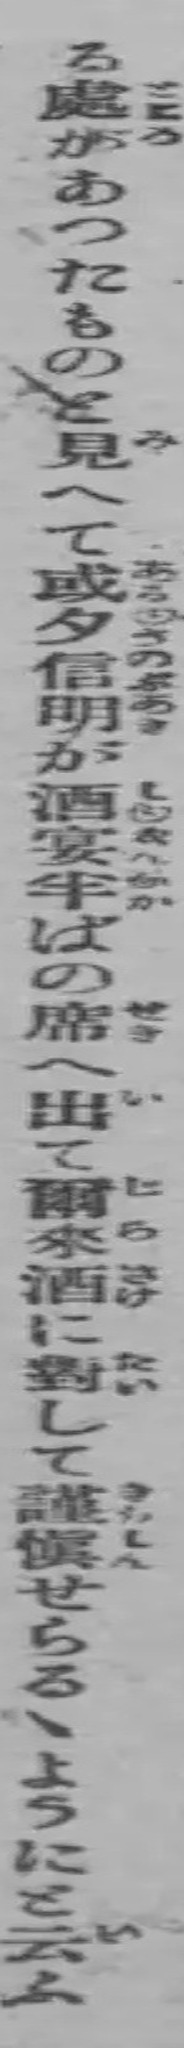る処があつたものと見へて或夕信明が酒宴半ばの席へ出て爾来酒に対して謹慎せらるゝようにと云ふ
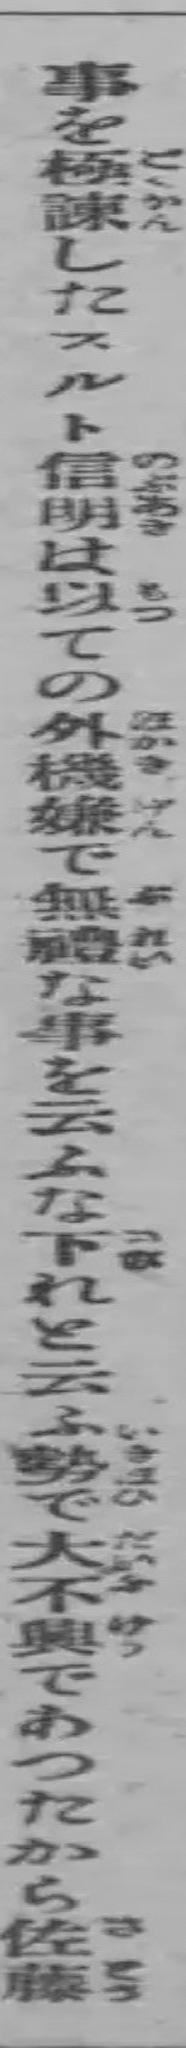事を極諫したスルト信明は以ての外機嫌で無礼な事を云ふな下れと云ふ勢で大不興であつたから佐藤
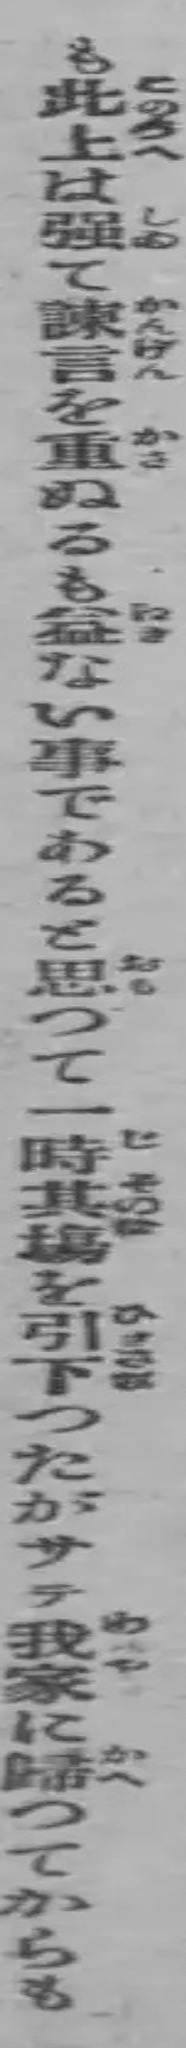も此上は強て諫言を重ぬるも益ない事であると思つて一時其場を引下つたがサテ我家に帰つてからも
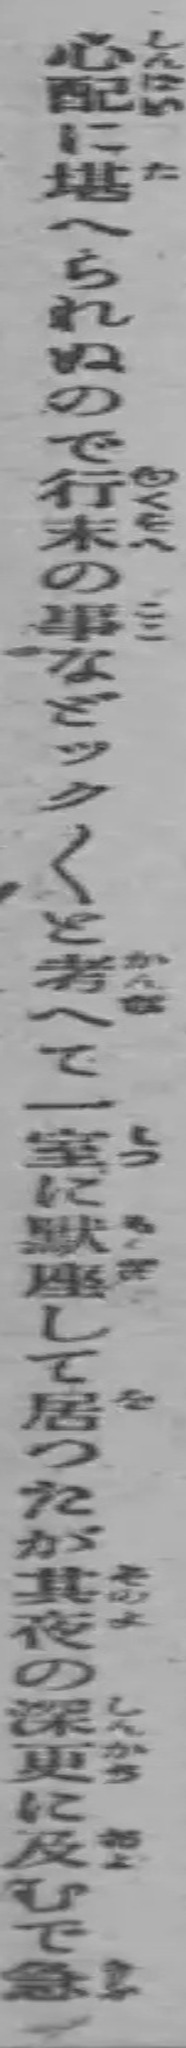心配に堪へられぬので行末の事などツク〳〵と考へて一室に黙座して居つたが其夜の深更に及むで急

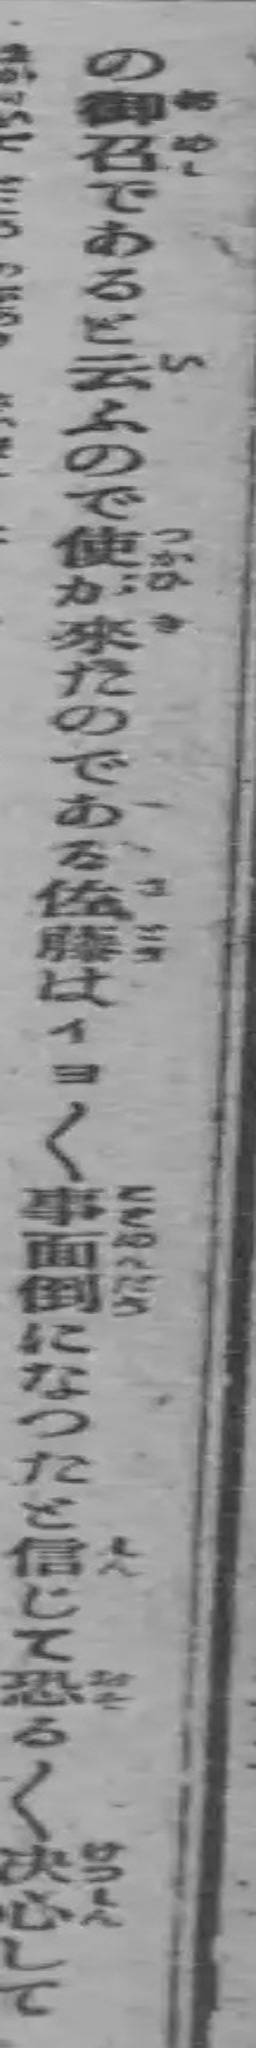の御召であると云ふので使が来たのである佐藤はイヨ〳〵事面倒になつたと信じて恐る〳〵決心して
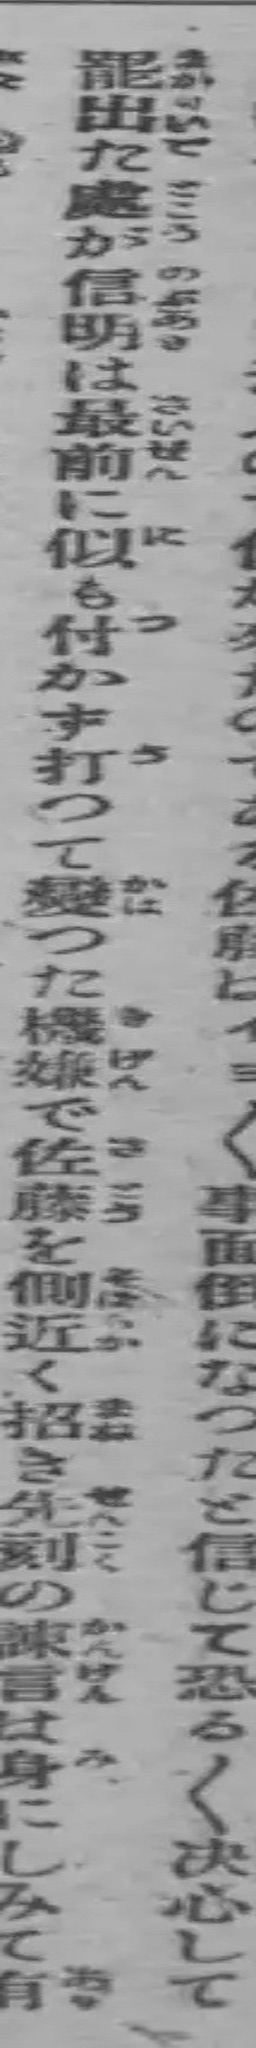罷出た処が信明は最前に似も付かず打つて変つた機嫌で佐藤を側近く招き先刻の諫言は身にしみて有
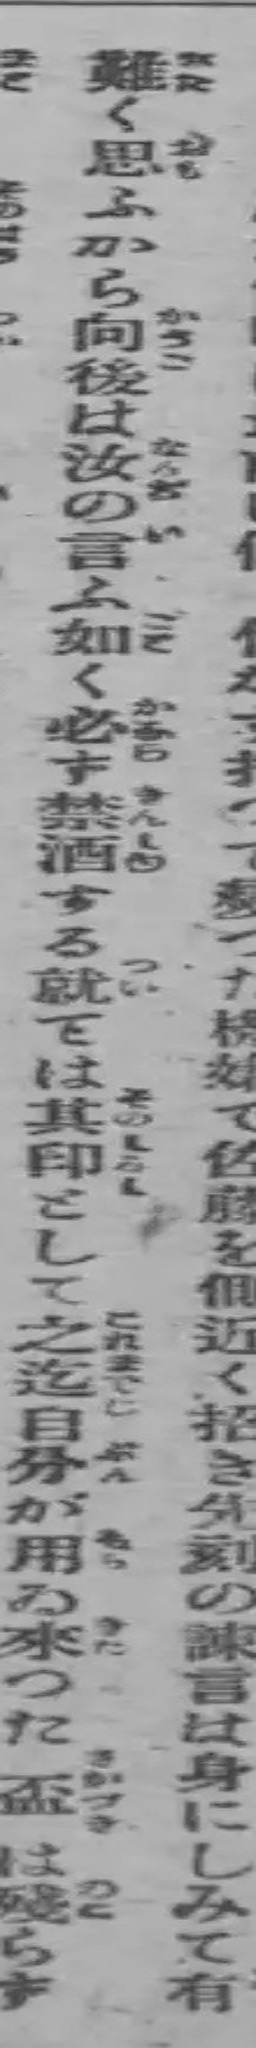難く思ふから向後は汝の言ふ如く必ず禁酒する就ては其印として之迄自分が用ゐ来つた盃は残らず
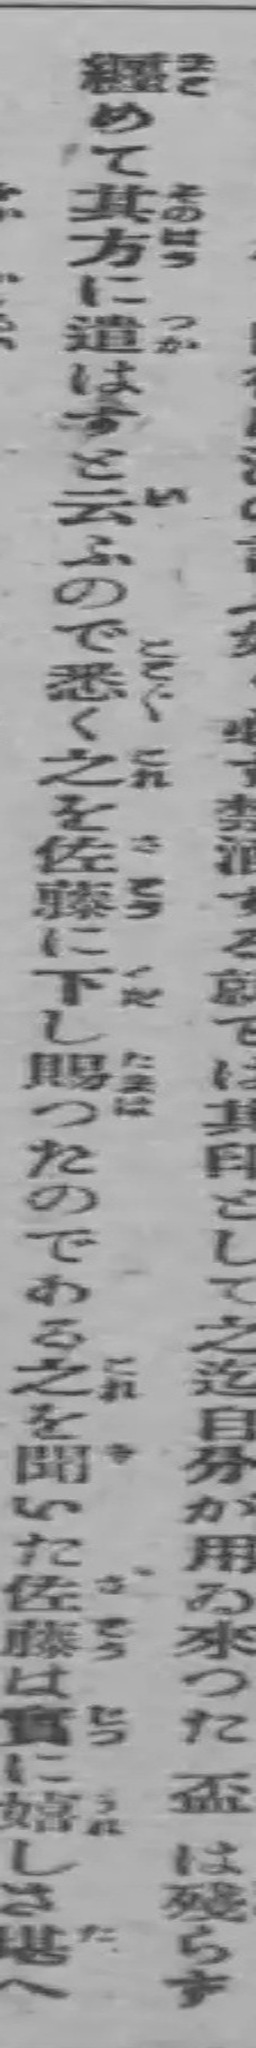纏めて其方に遣はすと云ふので悉く之を佐藤に下し賜つたのである之を聞いた佐藤は実に嬉しさ堪へ
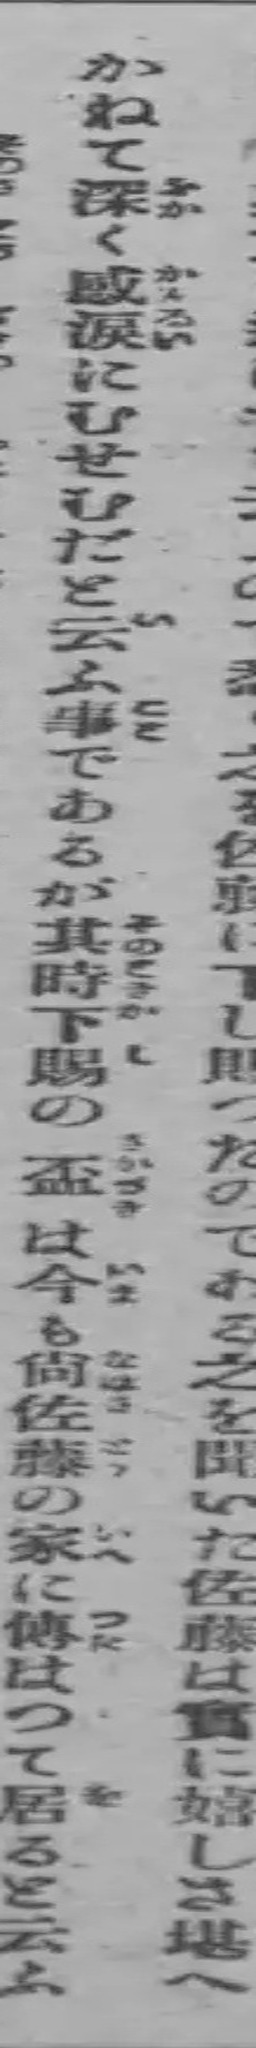かねて深く感涙にむせむだと云ふ事であるが其時下賜の盃は今も尚佐藤の家に伝はつて居ると云ふ
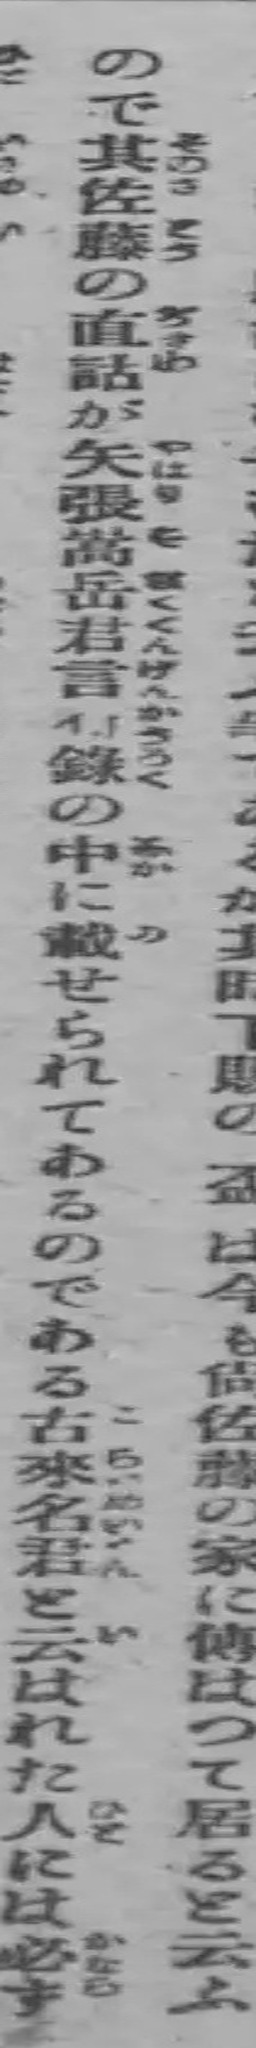ので其佐藤の直話が矢張嵩岳君言行録の中に載せられてあるのである古来名君と云はれた人には必ず
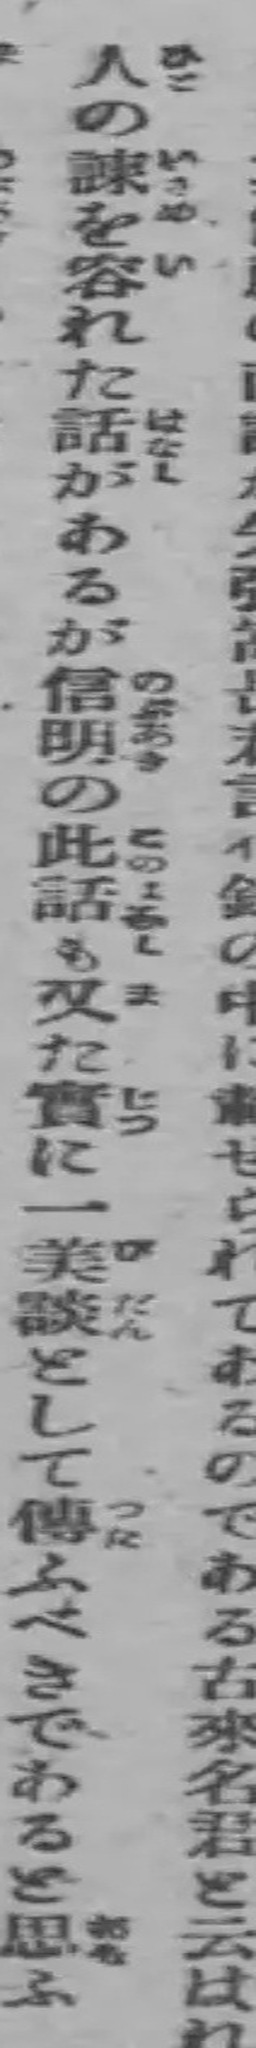人の諌を容れた話があるが信明の此話も又た実に一美談として伝ふべきであると思ふ
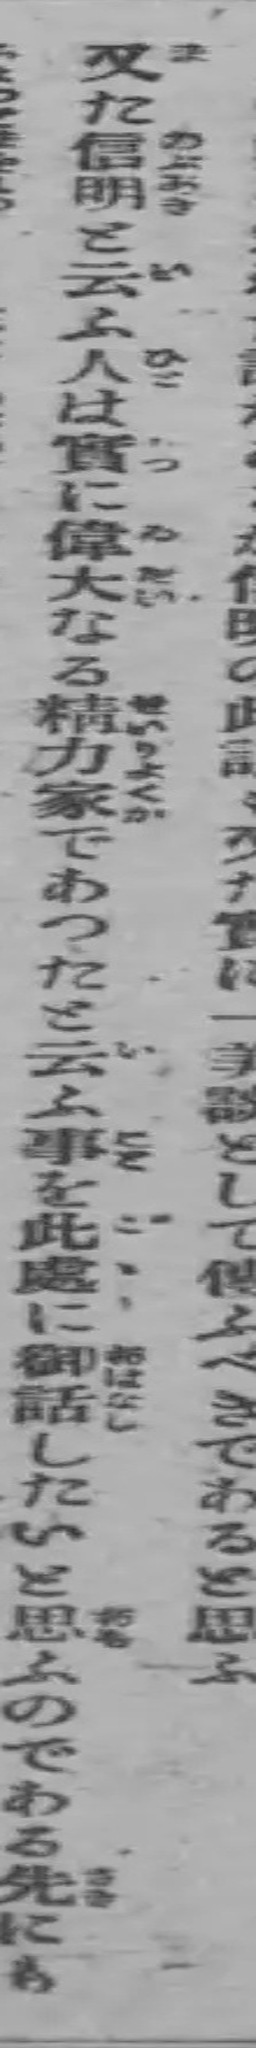信明の精力又た信明と云ふ人は実に偉大なる精力家であつたと云ふ事を此処に御話したいと思ふのである先にも
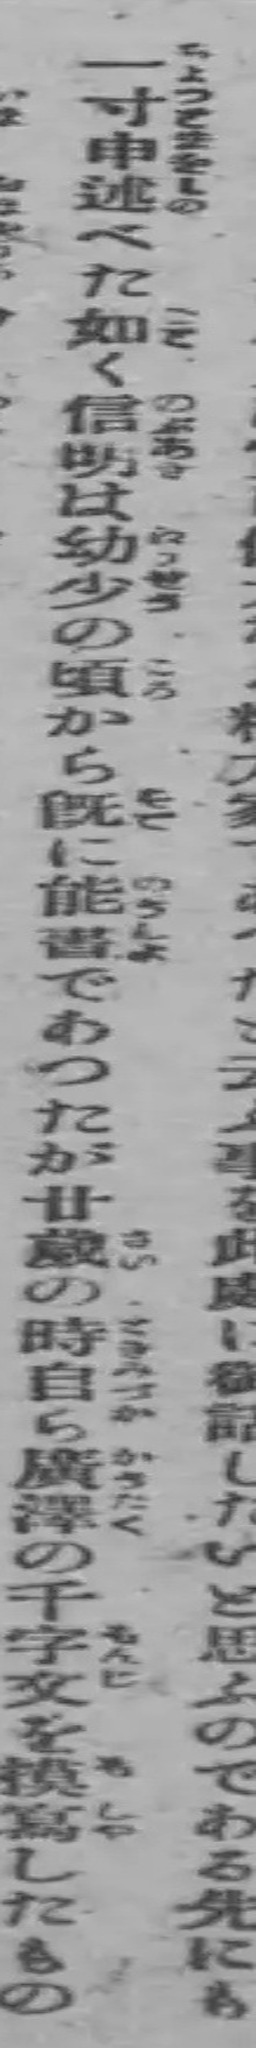一寸申述べた如く信明は幼少の頃から既に能書であつたが廿歳の時自ら公沢の千文字を模写したもの
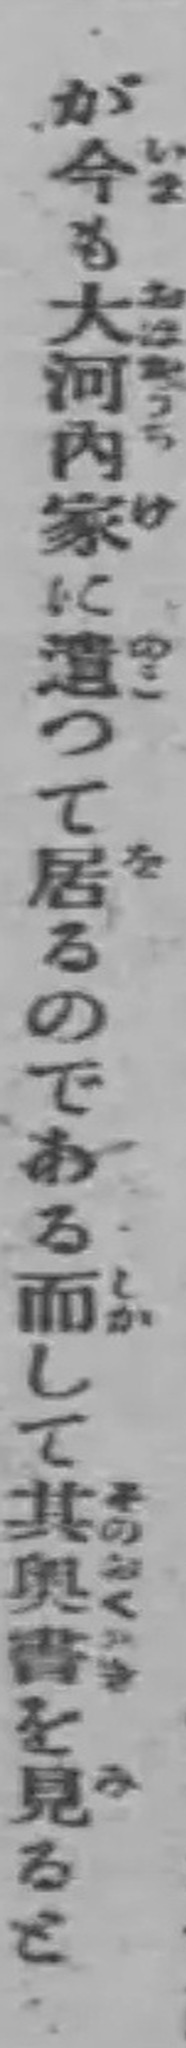が今も大河内家に遺つて居るのである而して其奥書を見ると
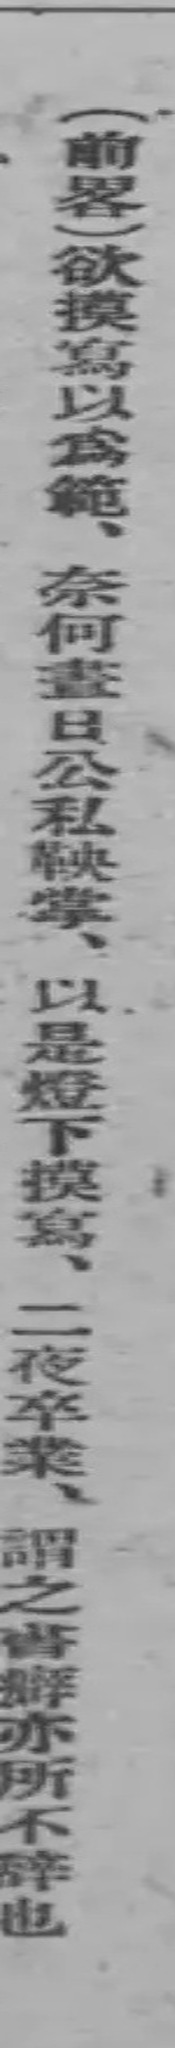(前略)欲模写以為範、奈何晝日公私鞅掌、以是燈下模写、二夜卒業、謂之書癖亦所不辞也
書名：豊橋市史談
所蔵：国立国会図書館 National Diet Library, JAPAN
